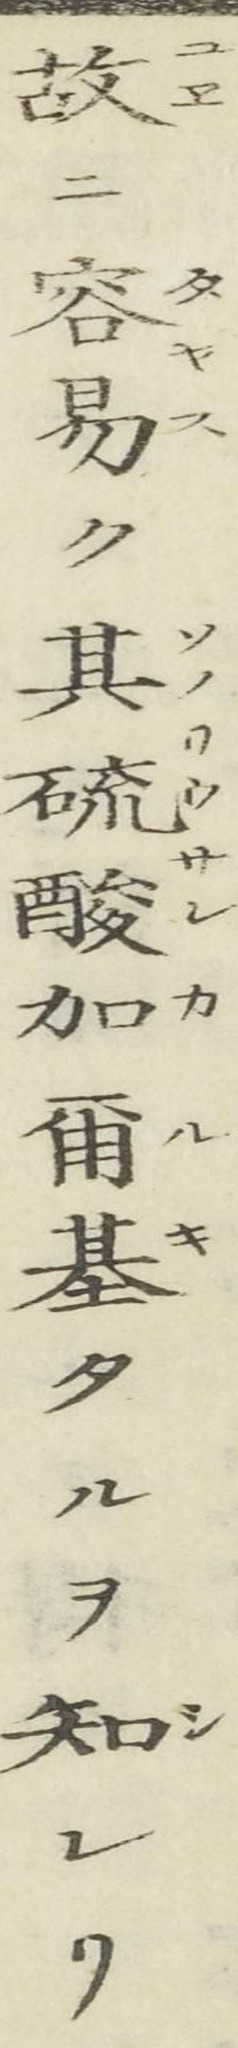故ニ容易ク其硫酸加爾基タルヲ知レリ
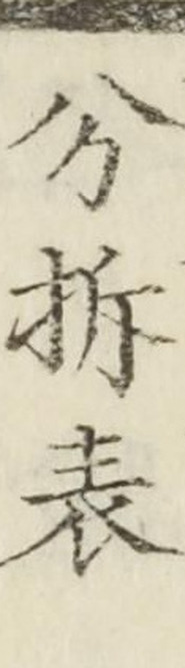分析表
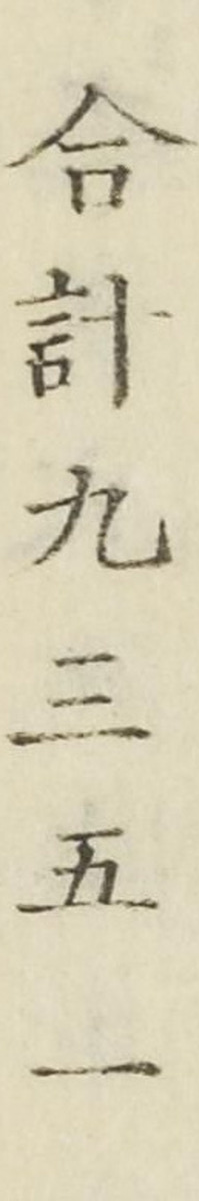合計九三五一
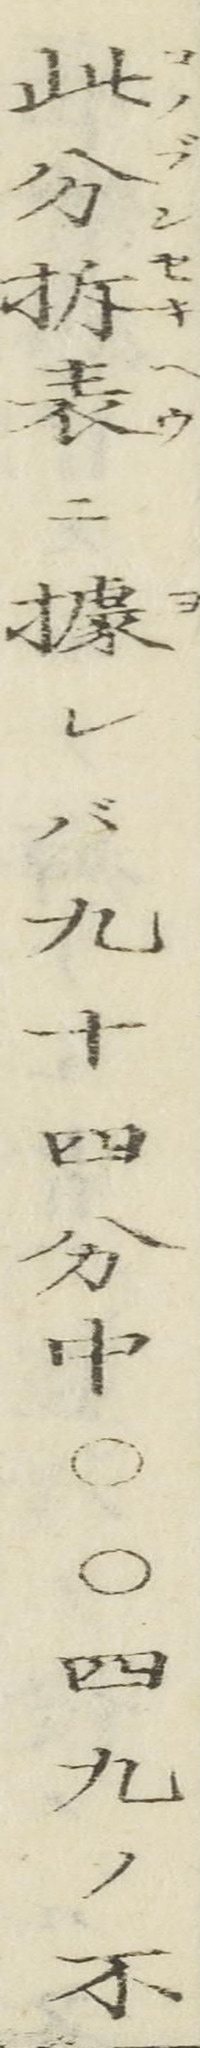此分析表ニ據レバ九十四分中〇〇四九ノ不
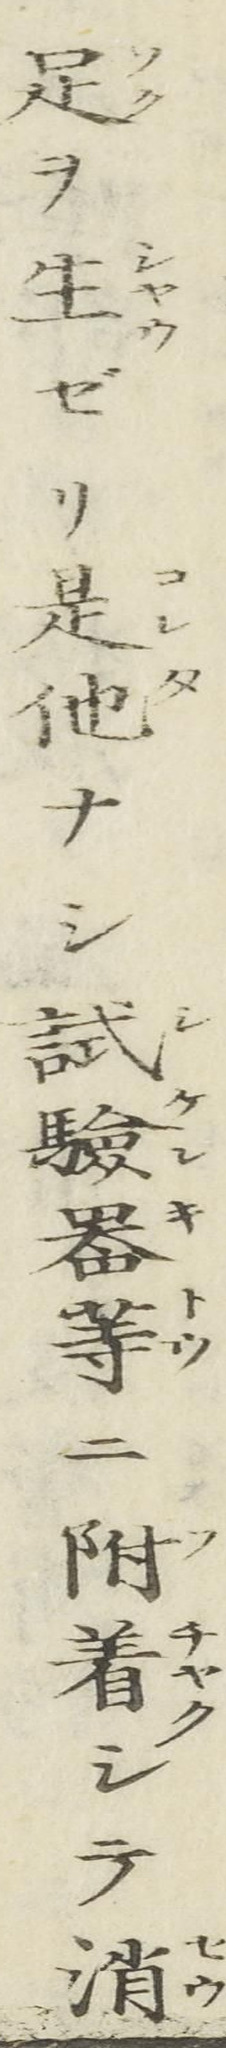足ヲ生ゼリ是他ナシ試験器等ニ附着シテ消
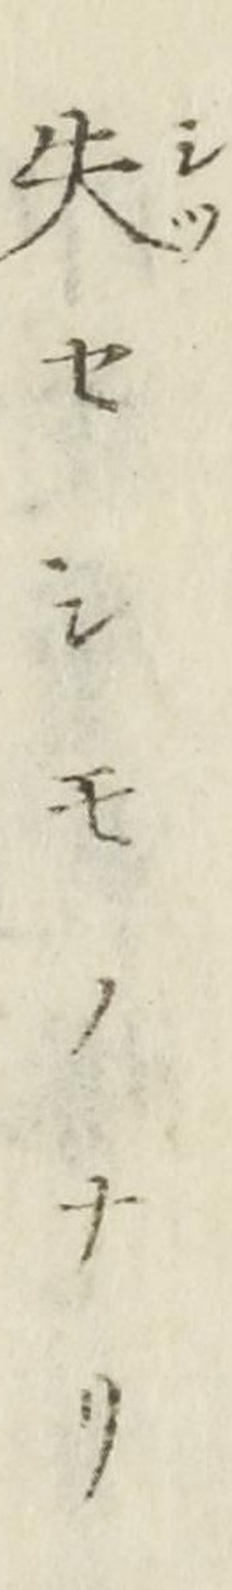失セシモノナリ
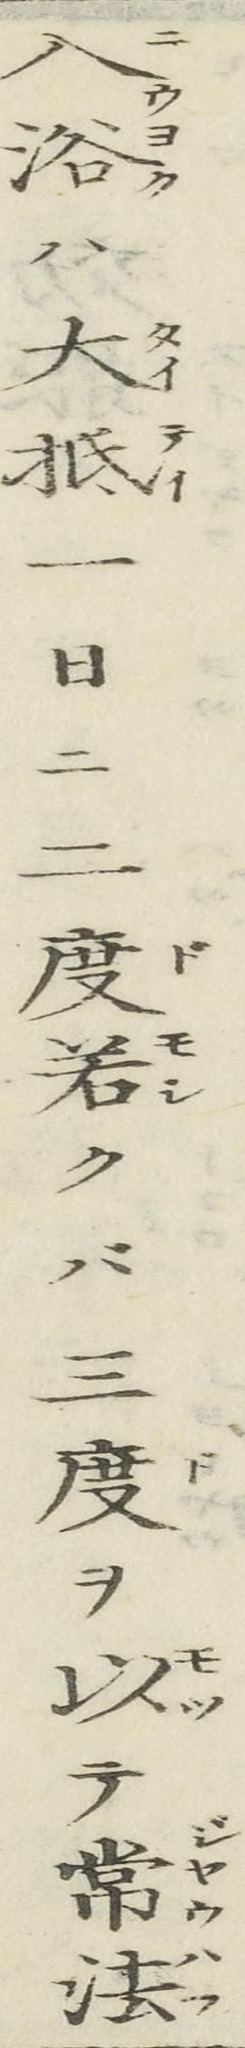入浴ハ大抵一日ニ二度若クバ三度ヲ以テ常法
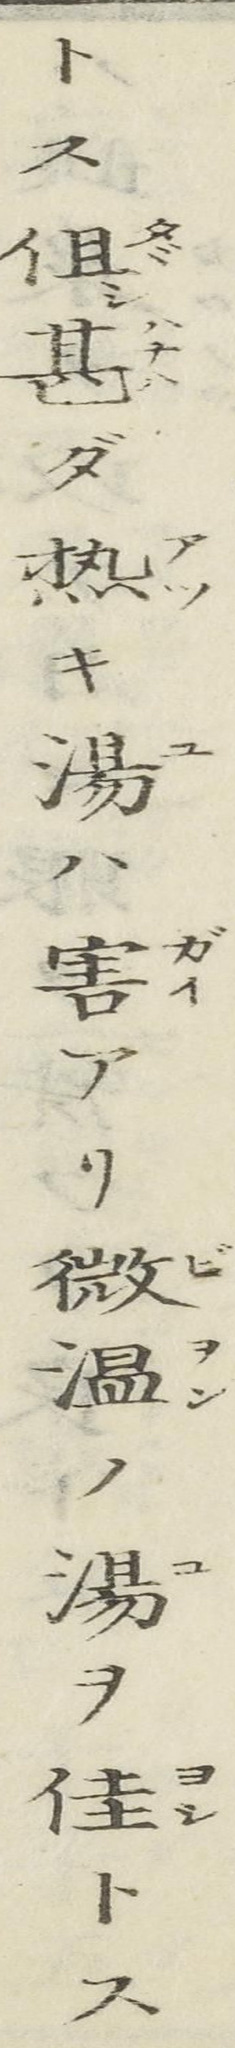トス伹シ甚ダ熱キ湯ハ害アリ微温ノ湯ヲ佳トス
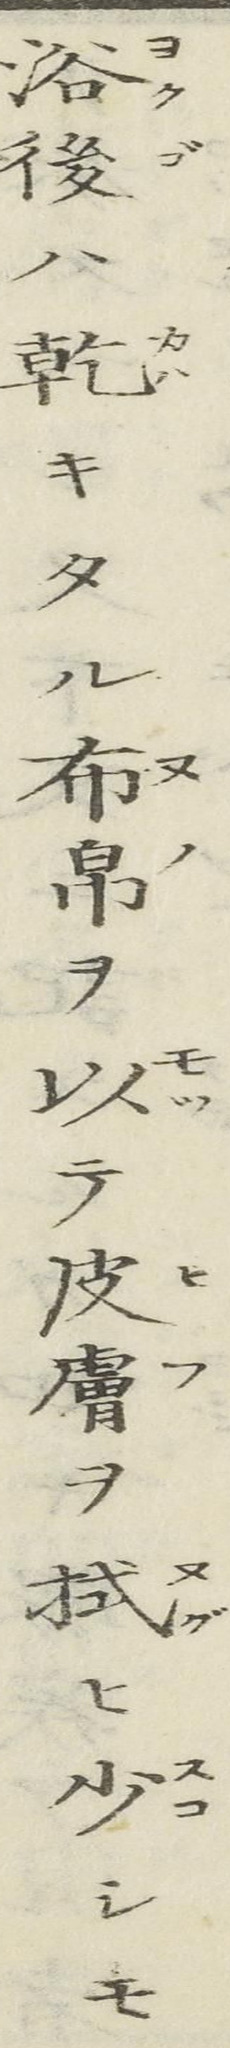浴後ハ乾キタル布帛ヲ以テ皮膚ヲ拭ヒ少シモ
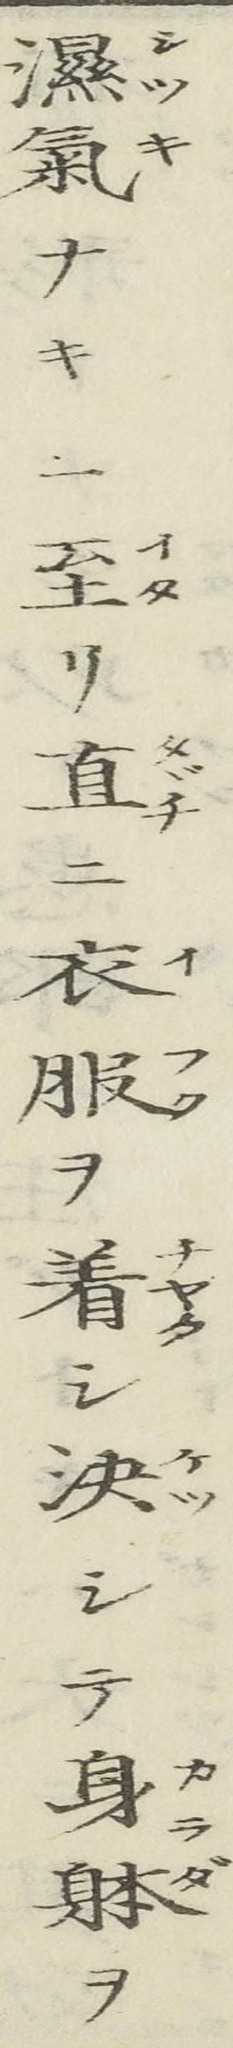湿気ナキニ至リ直ニ衣服ヲ着シ決シテ身体ヲ
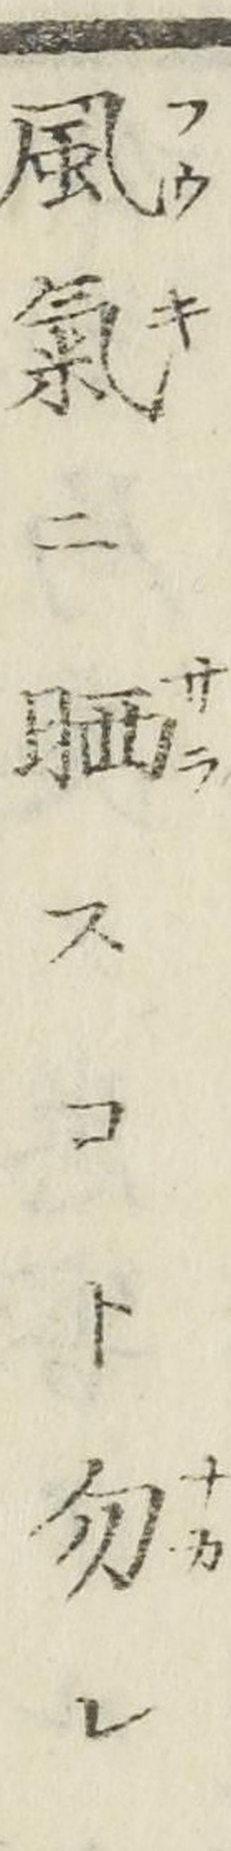風気ニ晒スコト勿レ
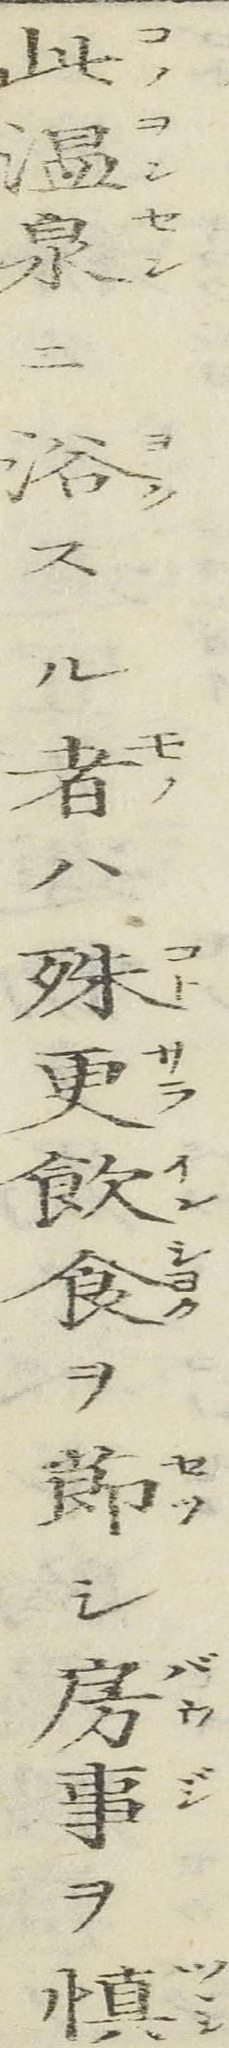此温泉ニ浴スル者ハ殊更飲食ヲ節シ房事ヲ慎

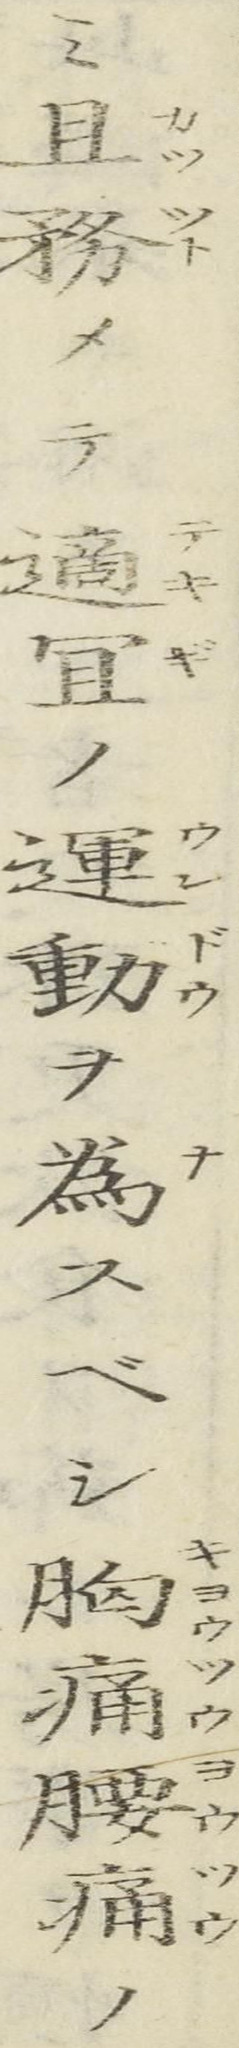ミ且務メテ適宜ノ運動ヲ為スベシ胸痛腰痛ノ
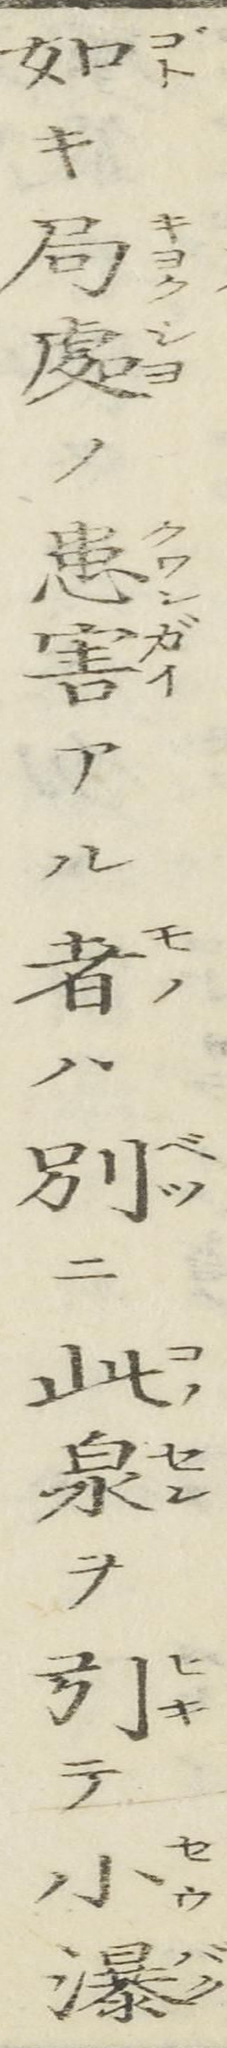如キ局処ノ患害アル者ハ別ニ此泉ヲ引テ小瀑
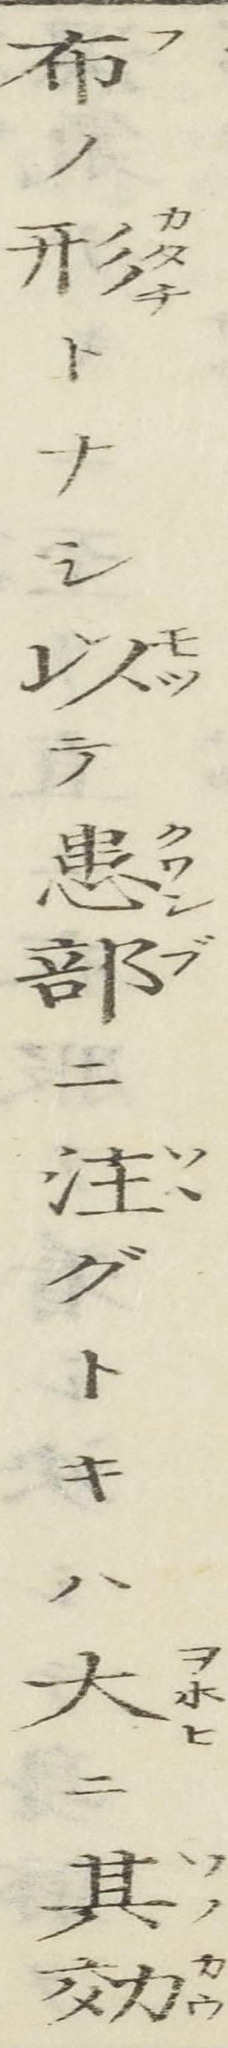布ノ形トナシ以テ患部ニ注グトキハ大ニ其効
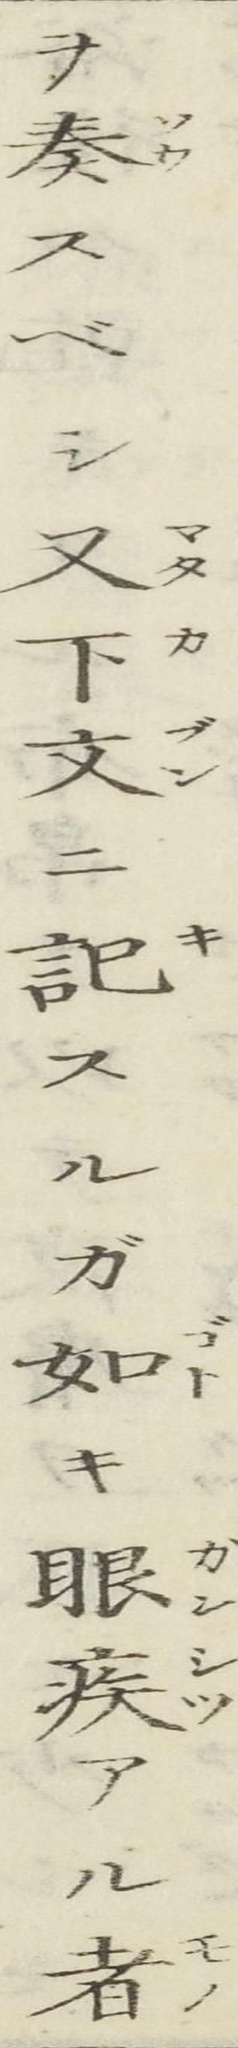ヲ奏スベシ又下文ニ記スルガ如キ眼疾アル者
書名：熱海温泉考　全
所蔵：東京大学地震研究所図書室 Earthquake Research Institute Library, The University of Tokyo, JAPAN
